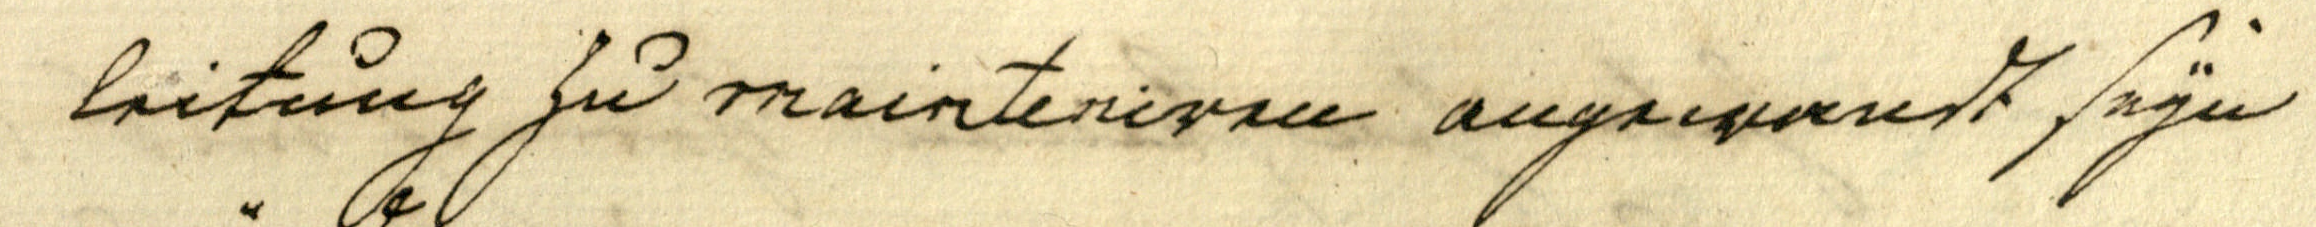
leitung zu mainteniren angewandt seyn
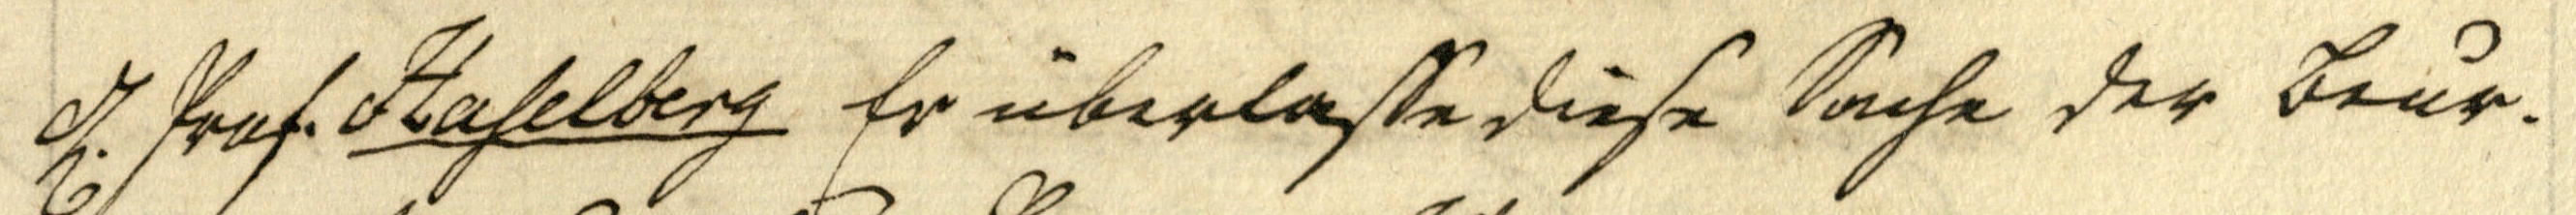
dh. Prof. Haselberg Er überlasse diese Sache der Beur-
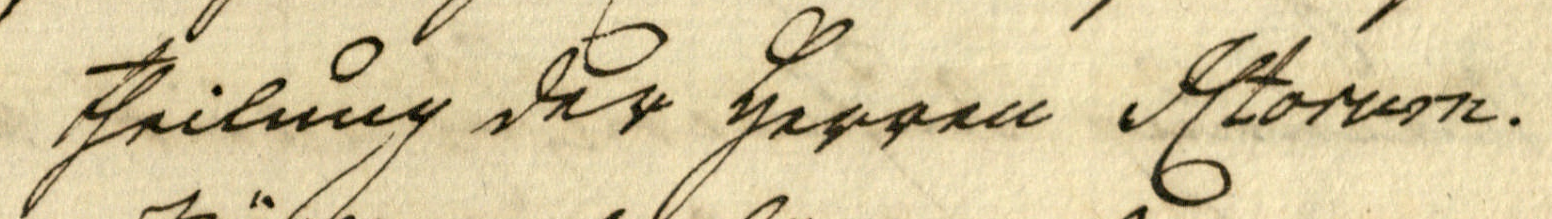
theilung der Herren Ictorum.
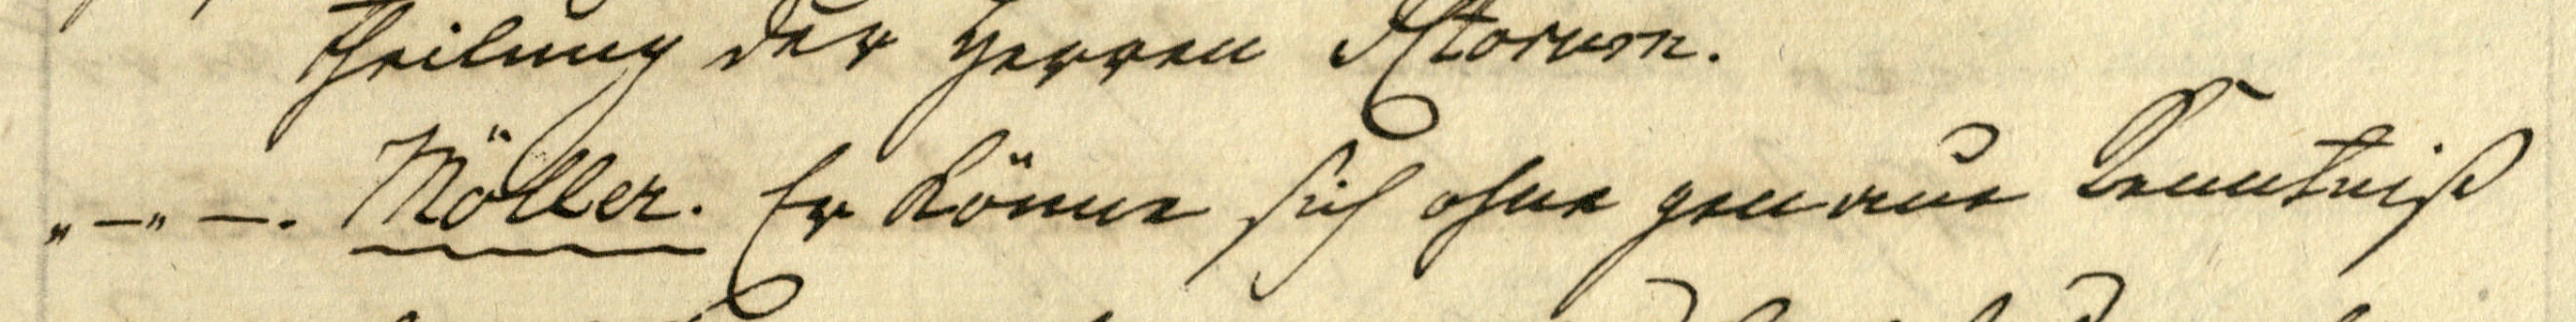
" - " - " Möller. Er könne sich ohne genaue Kenntniß
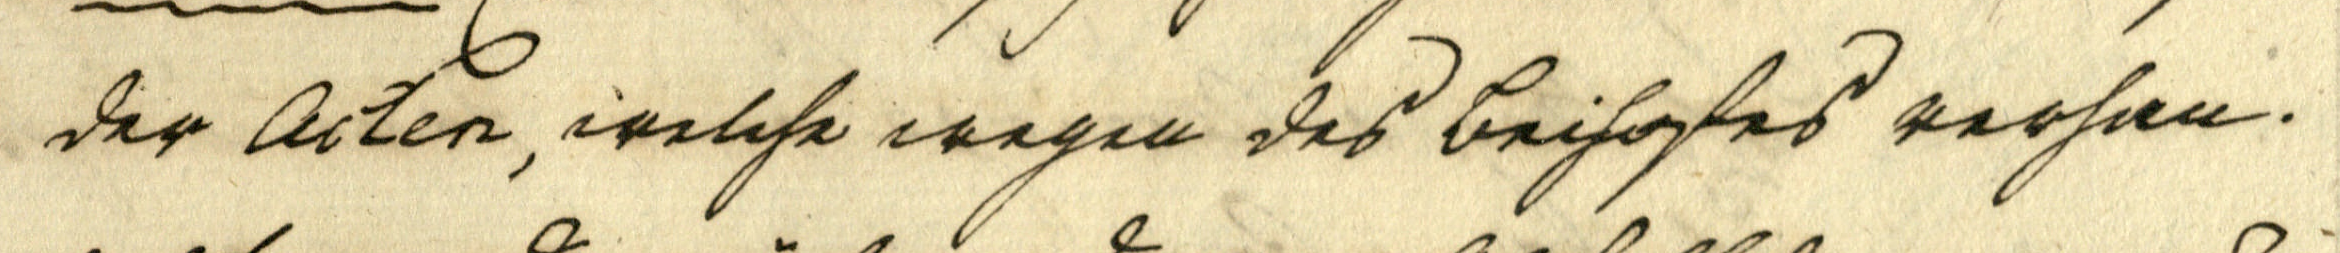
der Acten, welche wegen des Beihofes verhan-
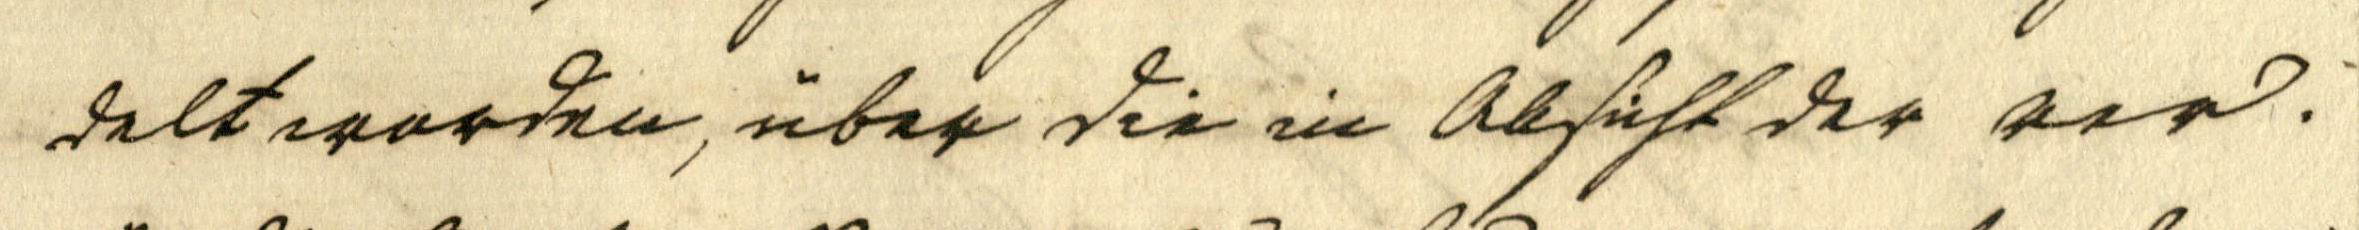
delt worden, über die in Absciht der ver-
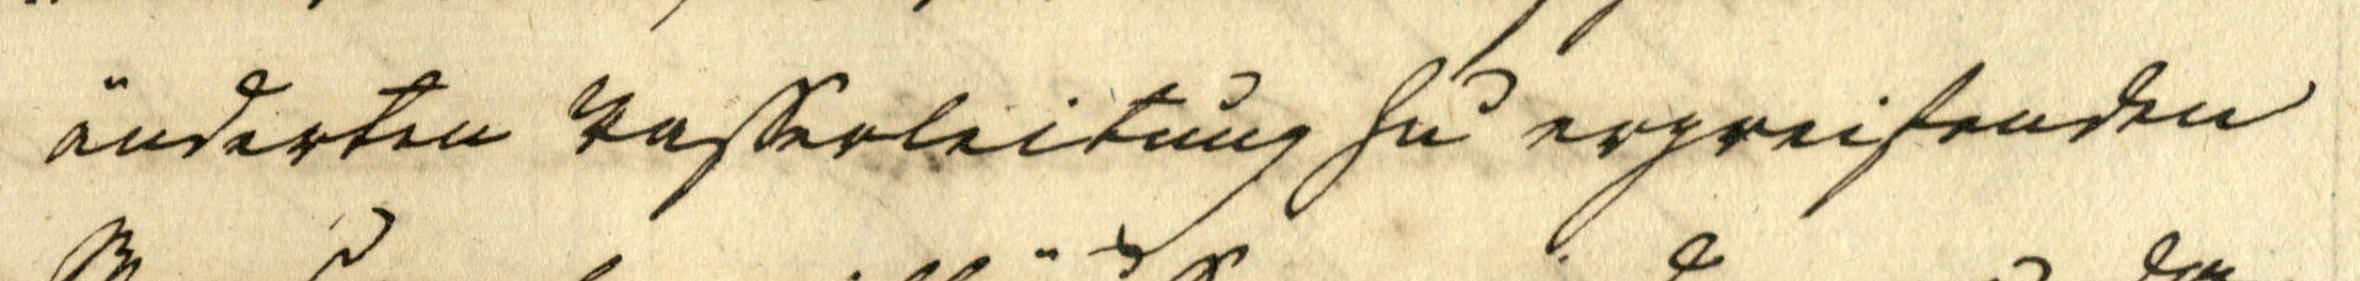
änderten Wasserleitung zu ergreifenden
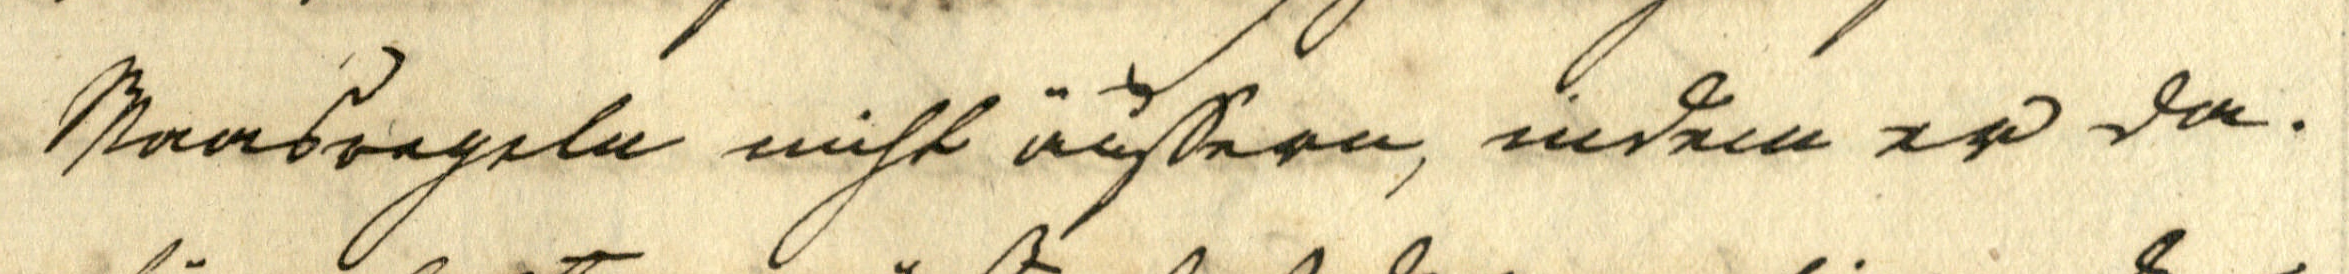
Maasregeln nicht äussern, indem er da-
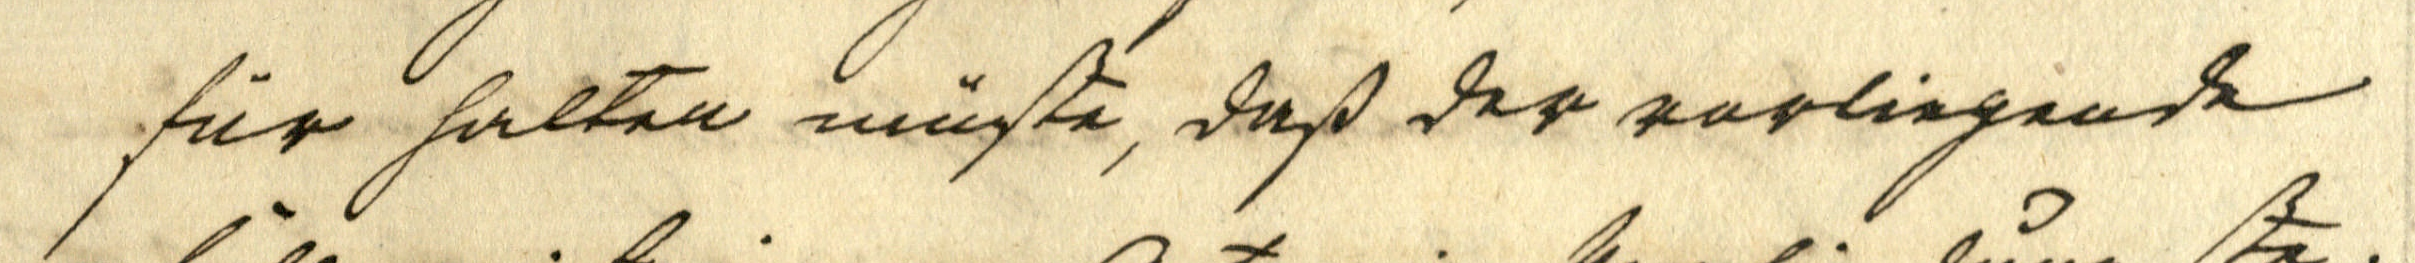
für halten müßte, daß der vorliegende
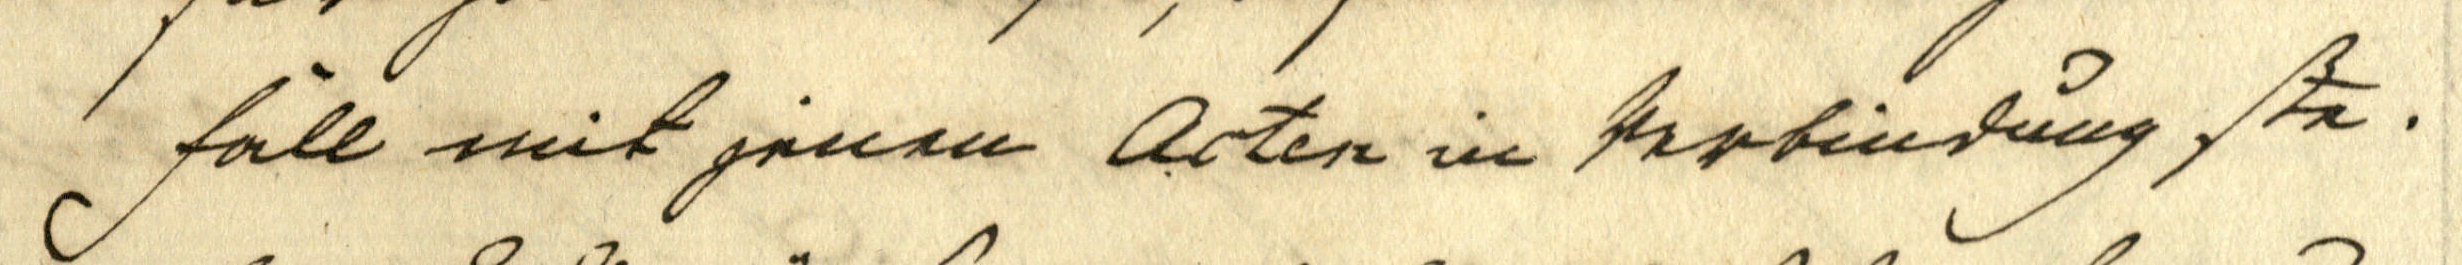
Fall mit jenen Acten in Verbindung ste-
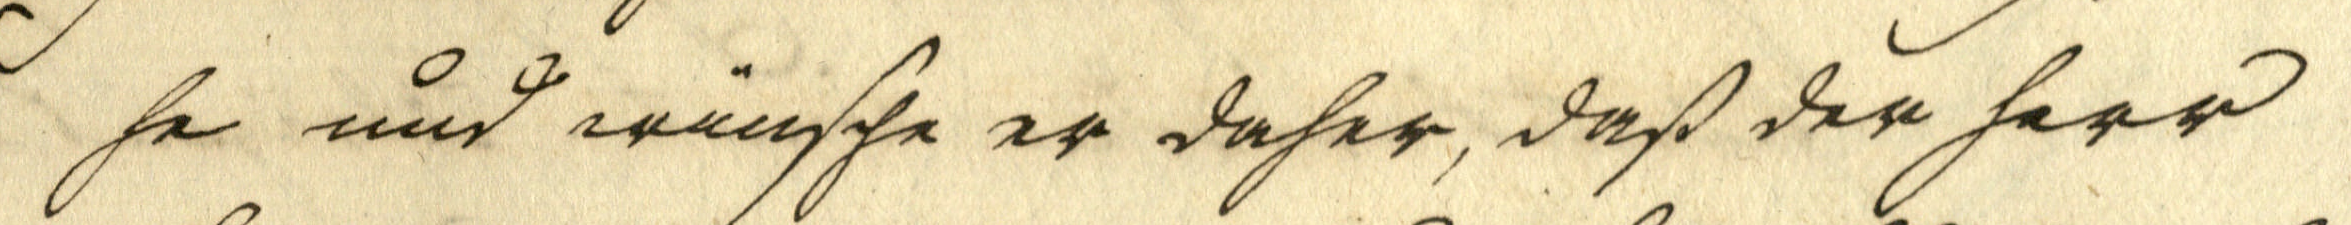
he und wünsche er daher, daß der Herr
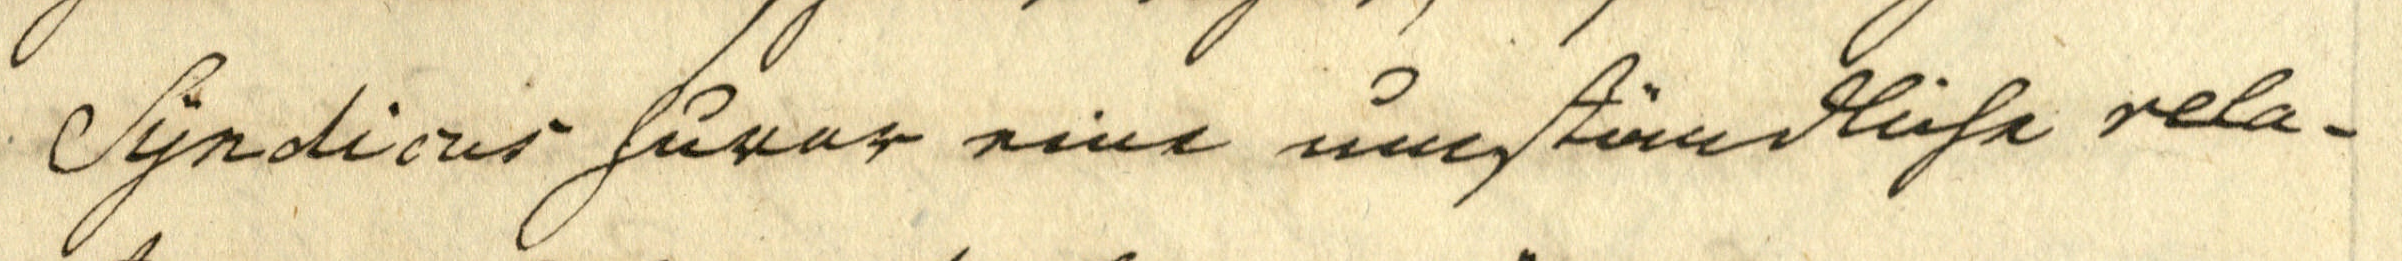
Syndicus zuvor eine umständliche rela-
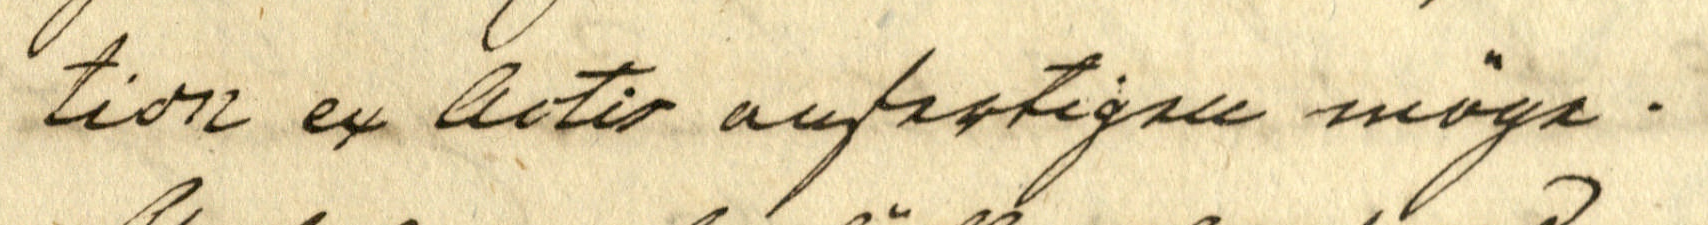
tion ex Actis anfertigen möge.
